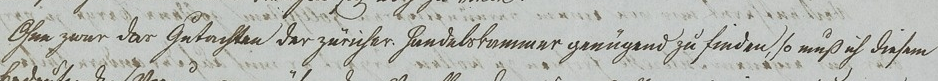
Ohne zwar das Gutachten der züricher. Handelskammer genügend zu finden, so muß ich diesem
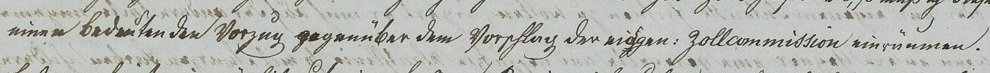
einen bedeutenden Vorzug gegenüber dem Vorschlag der eidgen: Zollcommission einräumen.
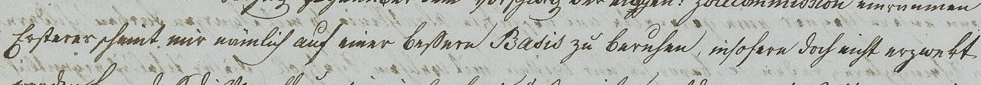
Ersteres scheint mir nämlich auf einer bessern Basis zu beruhen, insofern doch nicht erzwekt
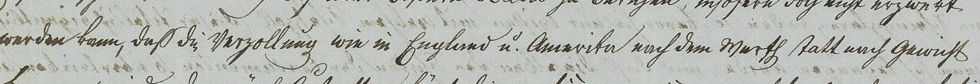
werden kann, daß die Verzollung wie in England u. Amerika nach dem Werth statt nach Gewicht
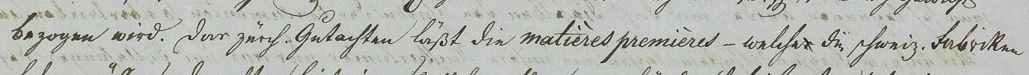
bezogen wird. Das zürch. Gutachten läßt die matières premières – welche die schweiz. Fabriken
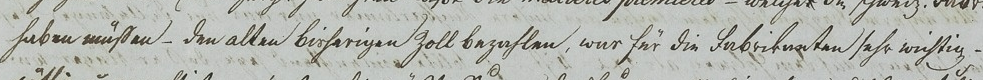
haben müssen – den alten bisherigen Zoll bezahlen, was für die Fabrikanten sehr wichtig –
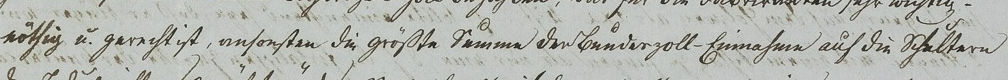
nöthig u. gerecht ist, ansonsten die größte Summe der Bundeszoll-Einnahme auf die Schultern
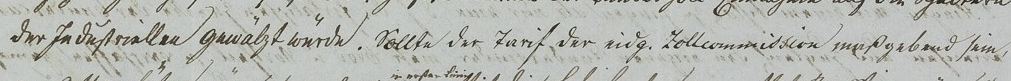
der Industriellen gewälzt würde. Sollte der Tarif der eidg. Zollcommission maßgebend sein,
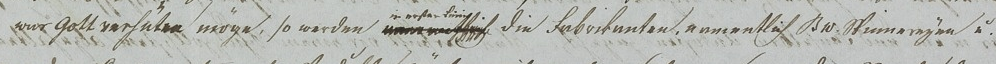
was Gott verhüten möge, so werden namentlichin erster Linie die Fabrikanten, namentlich Bw. Spinnereyen u.
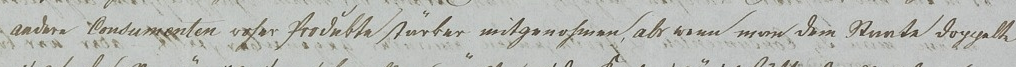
andere Consumenten roher Produkte stärker mitgenohmen, als wenn man dem Staate doppelte
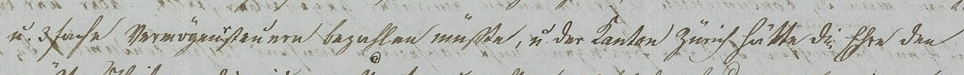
u. 3fache Vermögenssteuern bezahlen müßte, u. der Kanton Zürich hätte die Ehre den
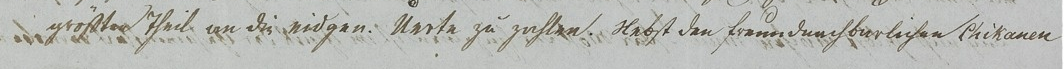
größten Theil an die eidgen. Uerte zu zahlen. Nebst den freundnachbarlichen Chikanen
